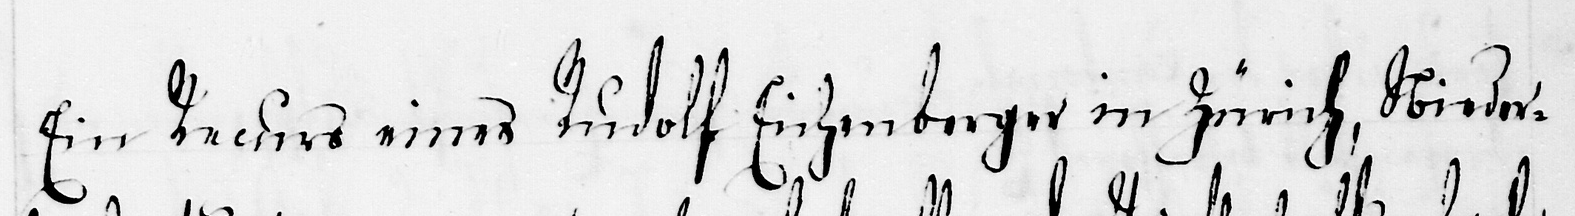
Ein Recurs eines Rudolf Eichenberger in Zürich, Nieder¬
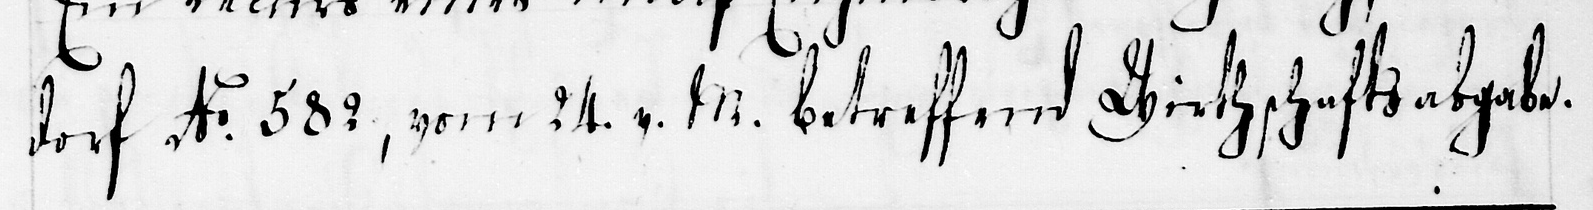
dorf No. 582, vom 24. v. M. betreffend Wirthschaftsabgabe.
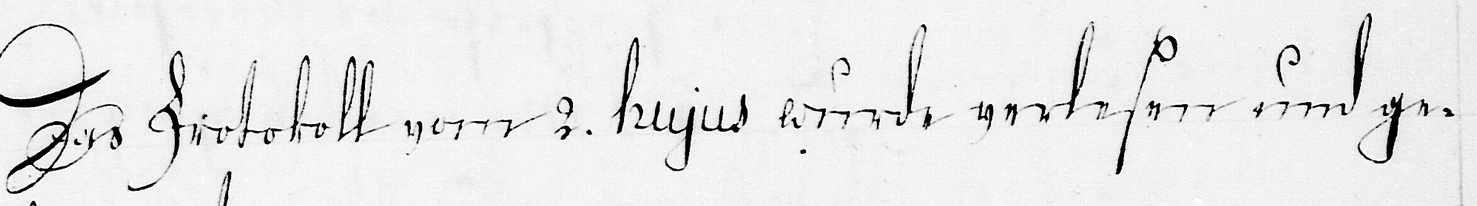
Das Protokoll vom 2. hujus wurde verlesen und ge¬
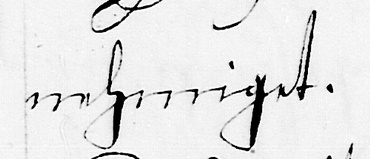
nehmiget.
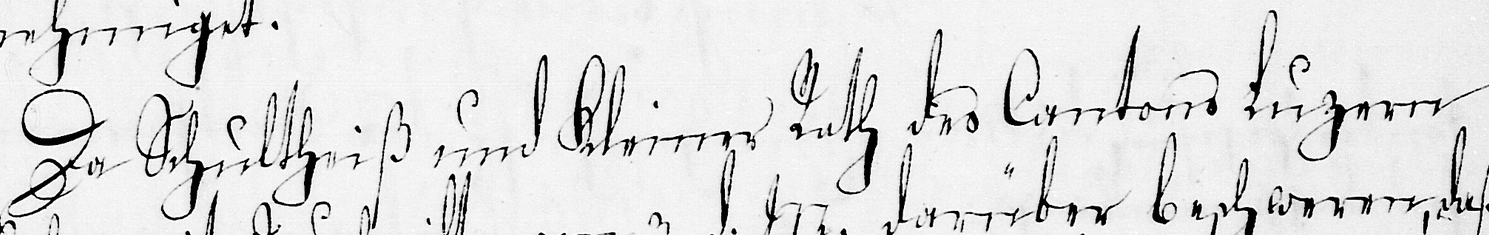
Da Schultheiß und Kleiner Rath des Cantons Luzern
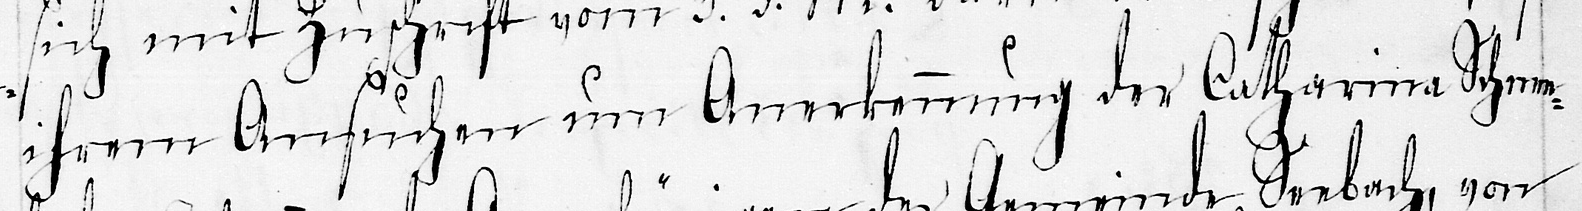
ihrem Ansuchen um Anerkennung der Catharina Schne¬
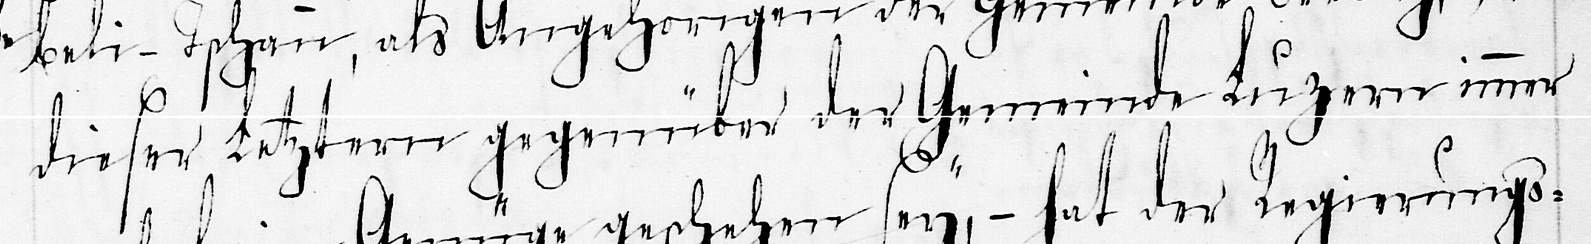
dieser Letztern gegenüber der Gemeinde Luzern immer
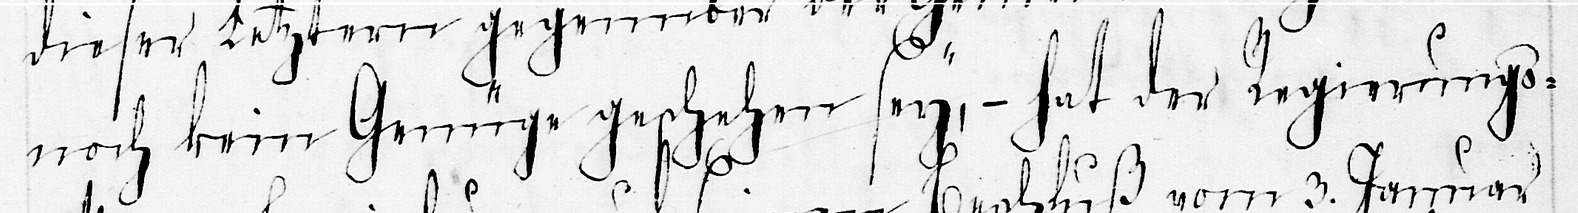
noch kein Genüge geschehen sey, – hat der Regierungs¬
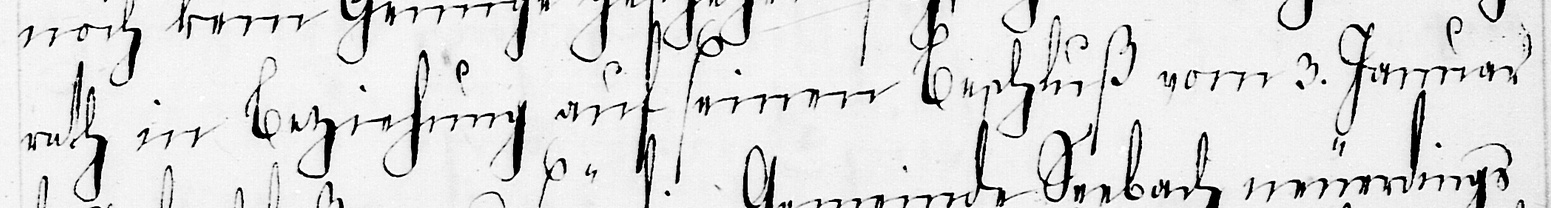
rath in Beziehung auf seinen Beschluß vom 3. Januar
